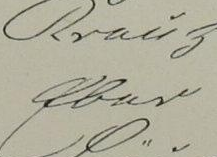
Eber
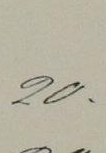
20
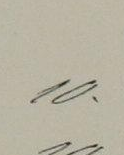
10
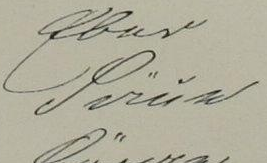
Säue
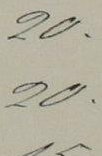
20
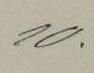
10
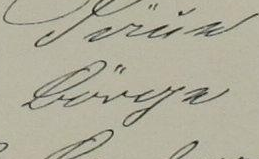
Börge
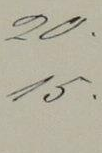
15
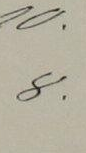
8
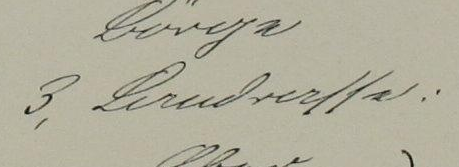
3. Landrasse:
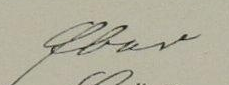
Eber
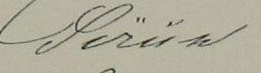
Säue
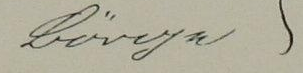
Börge
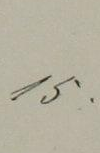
15
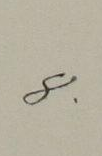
8
